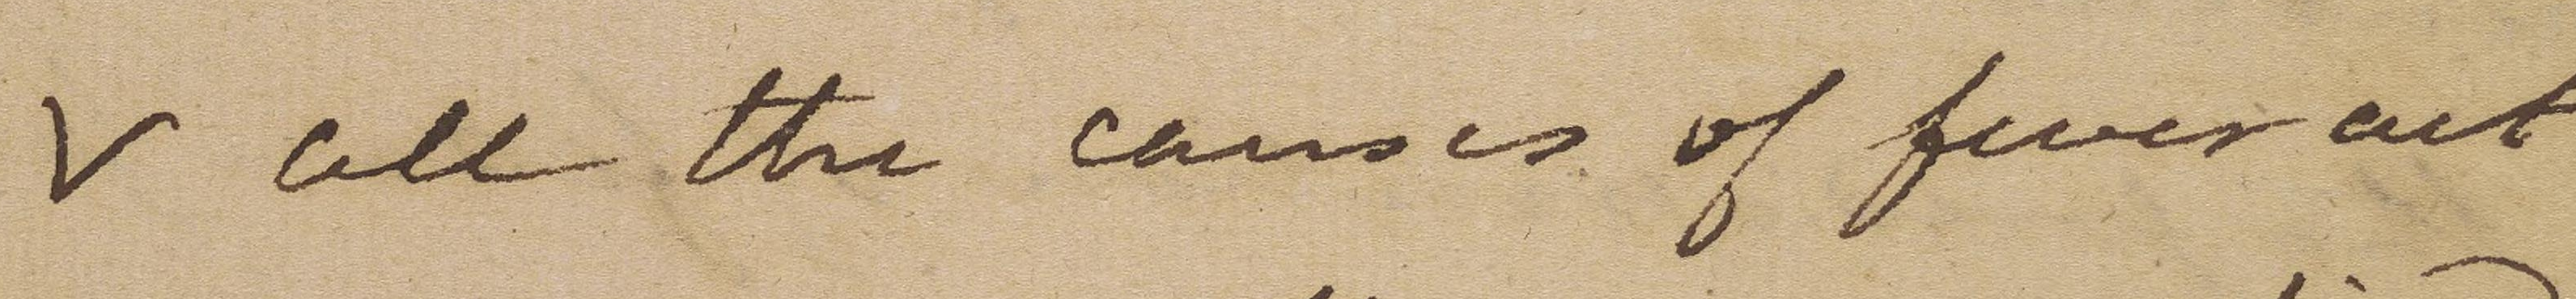V all the causes of fever act
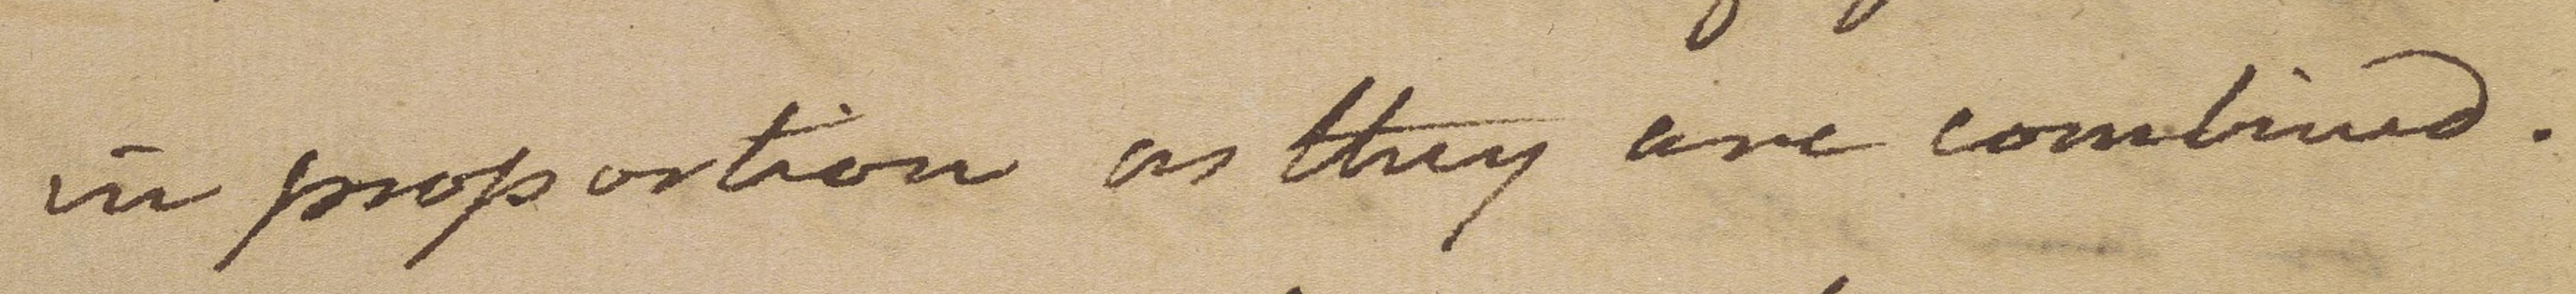in proportion as they are combined
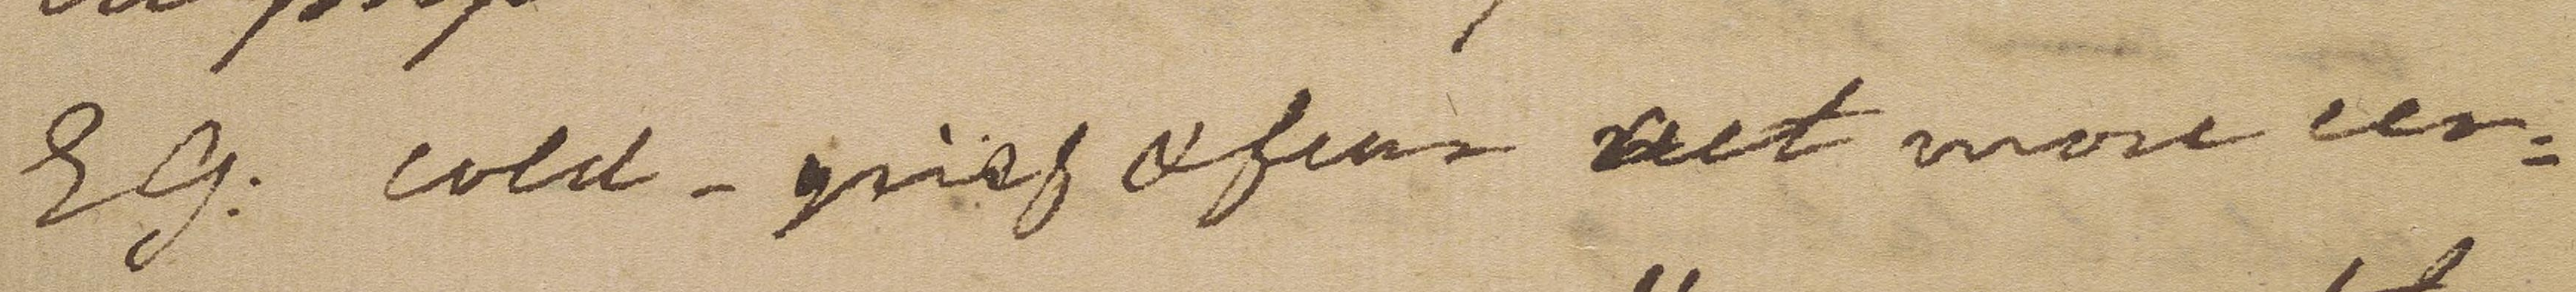Eg: cold, grief & fear act more cer-
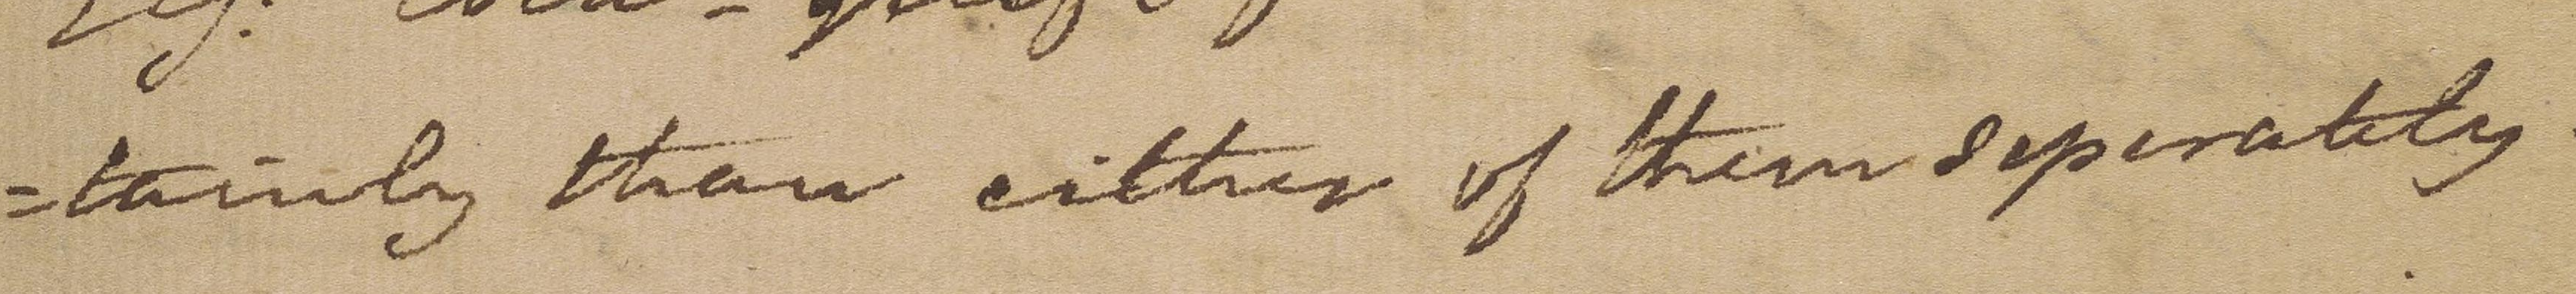-tainly than either of them separately
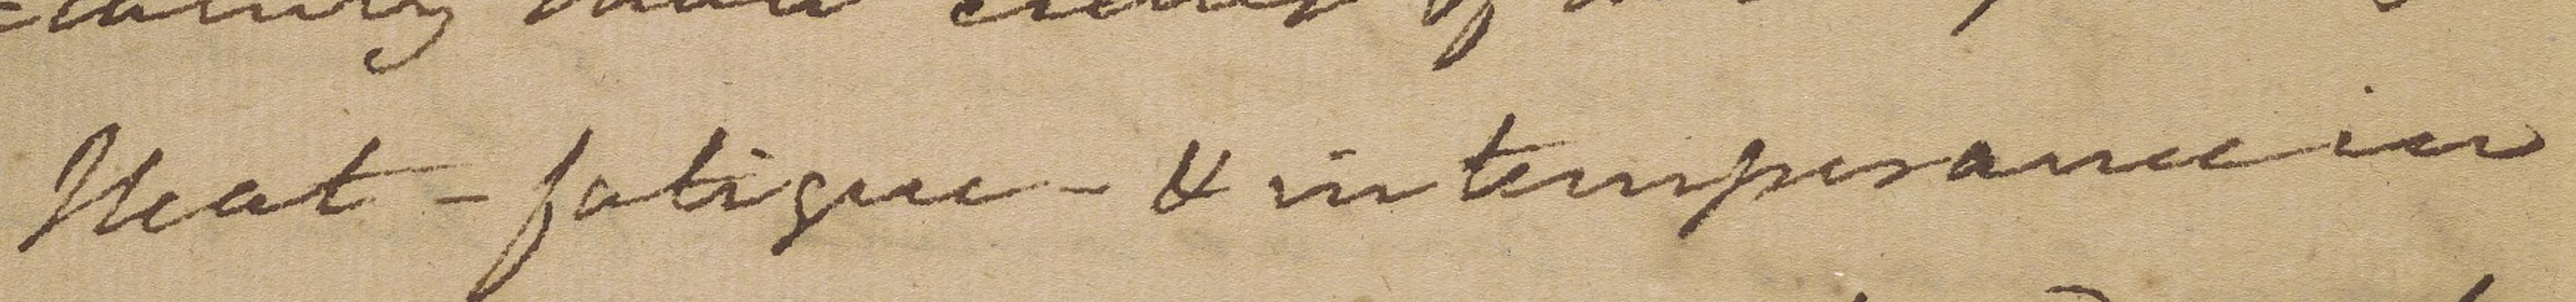Heat, fatigue, & intemperance in
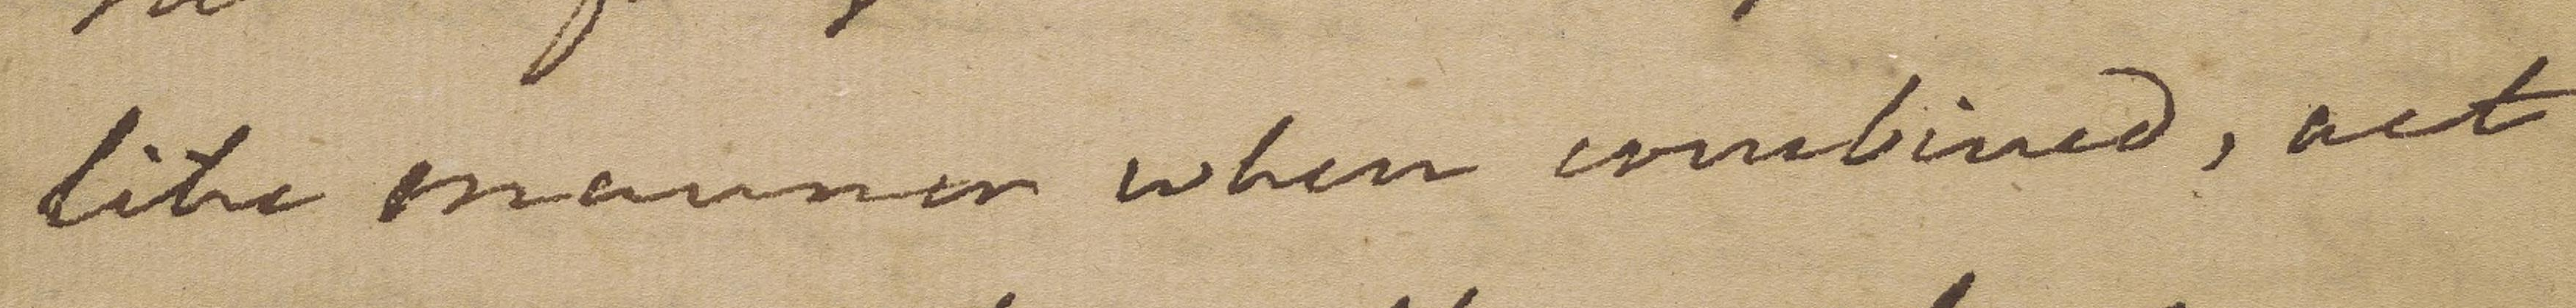like manner when combined, act
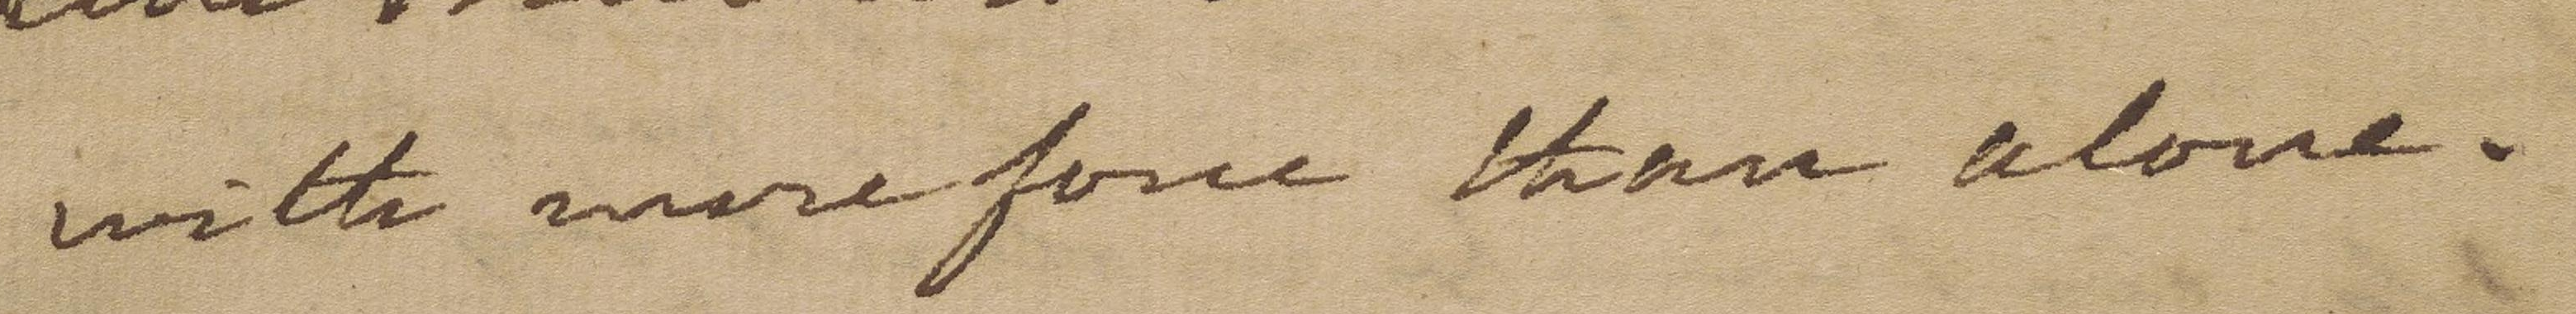with more force than above.
